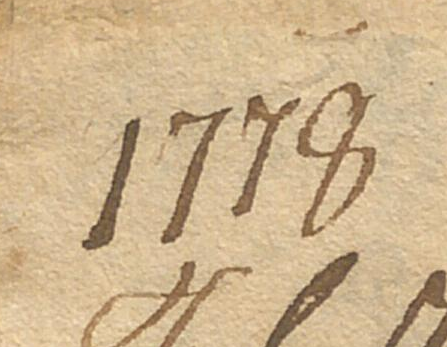1778
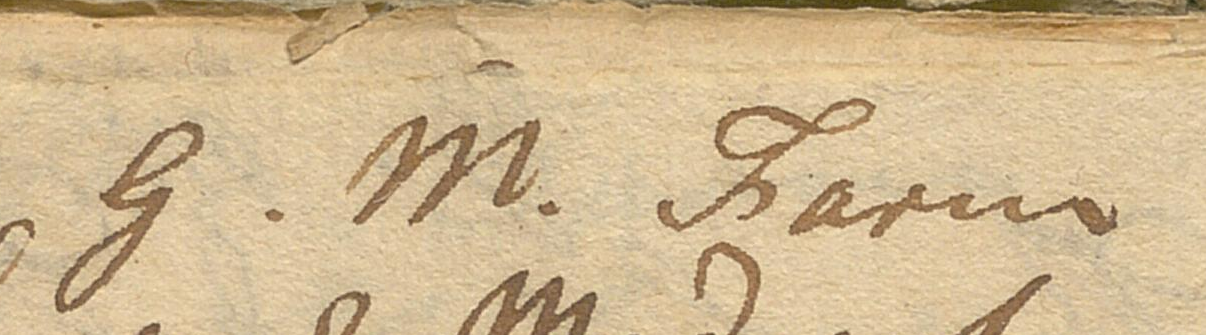G. M. Farm
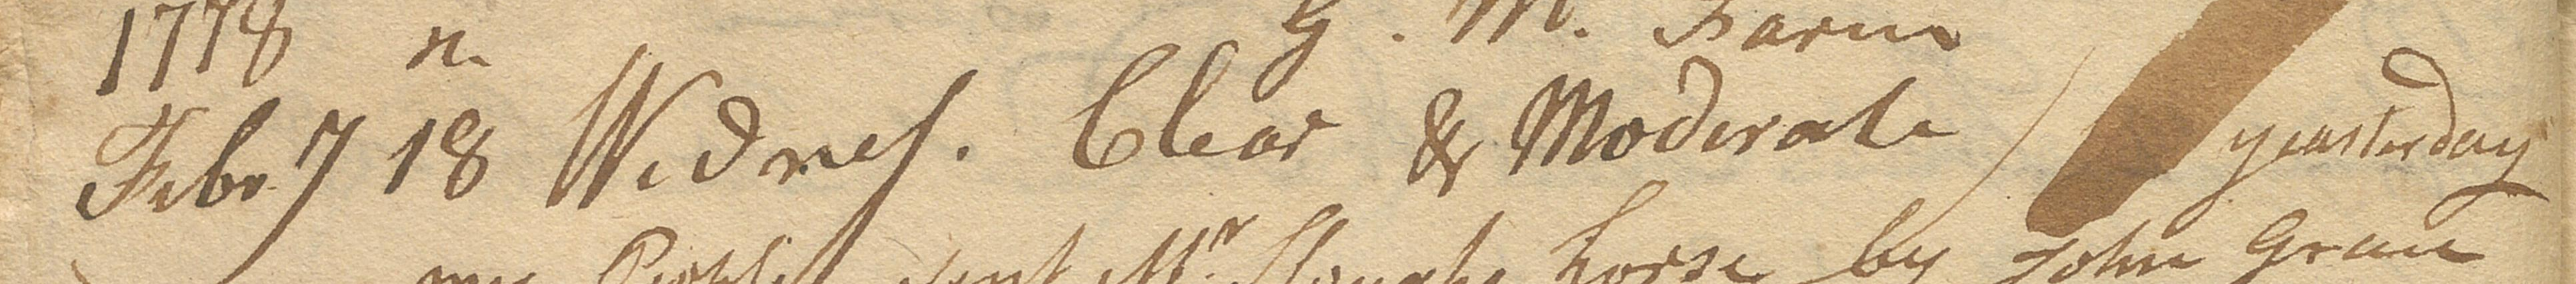Febr^y 18^th Wednes. Clear & Moderate) yeasterday
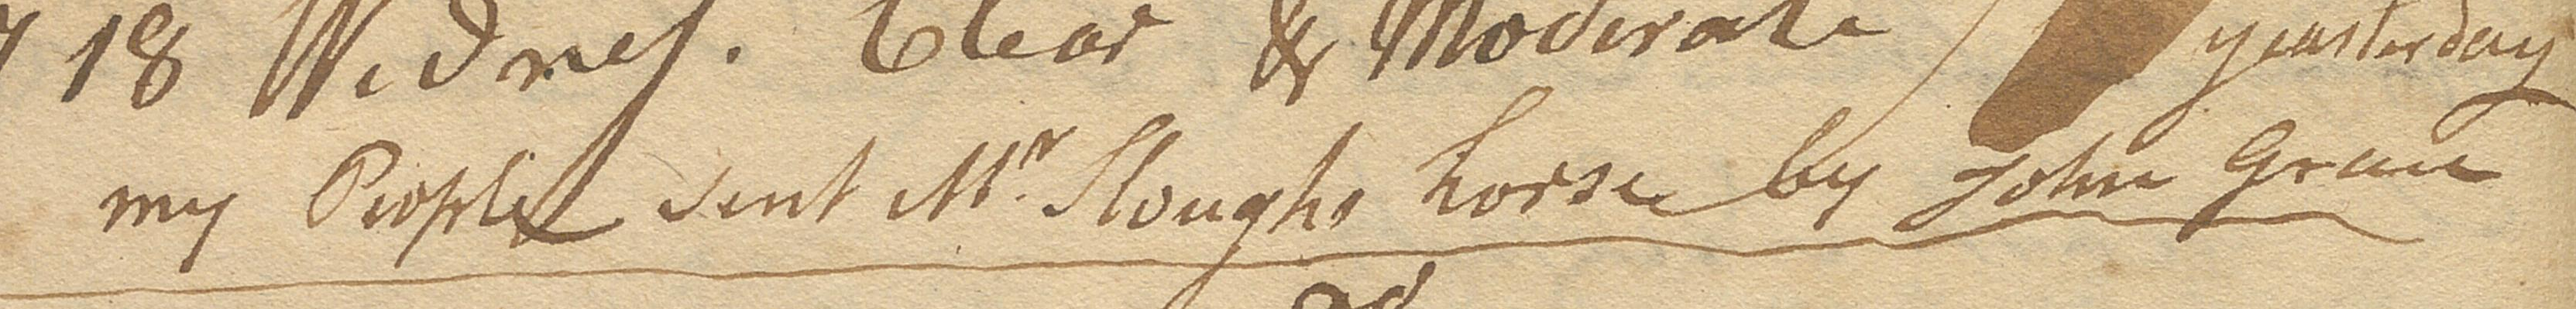my Peeple sent M^r. Sloughs horse by John Grau
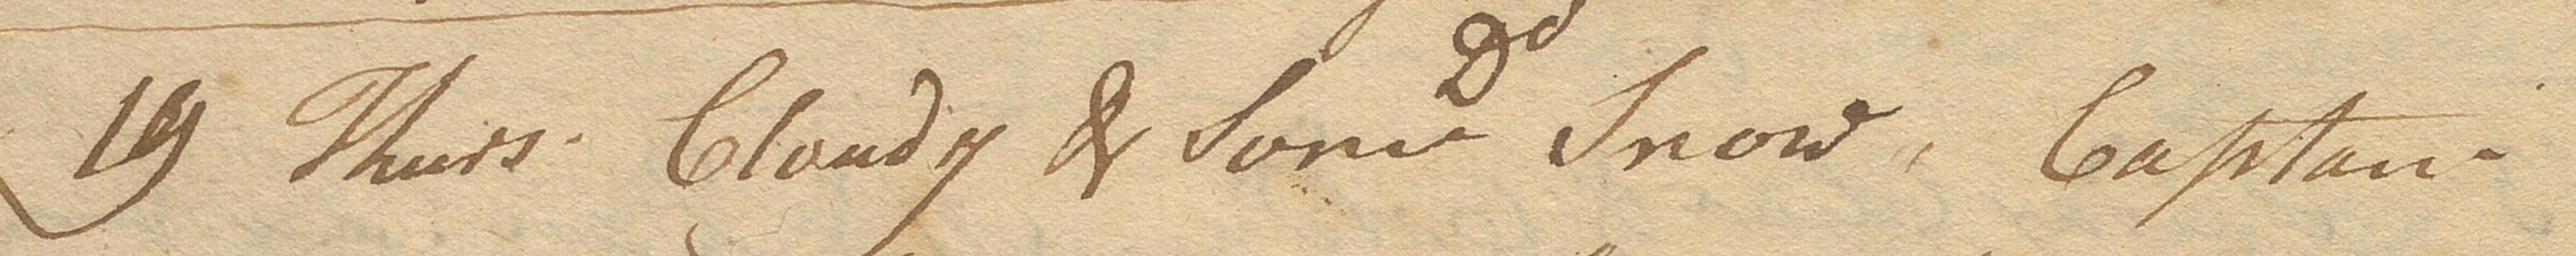19 Thurs. Cloudy & Some Snow, Captan
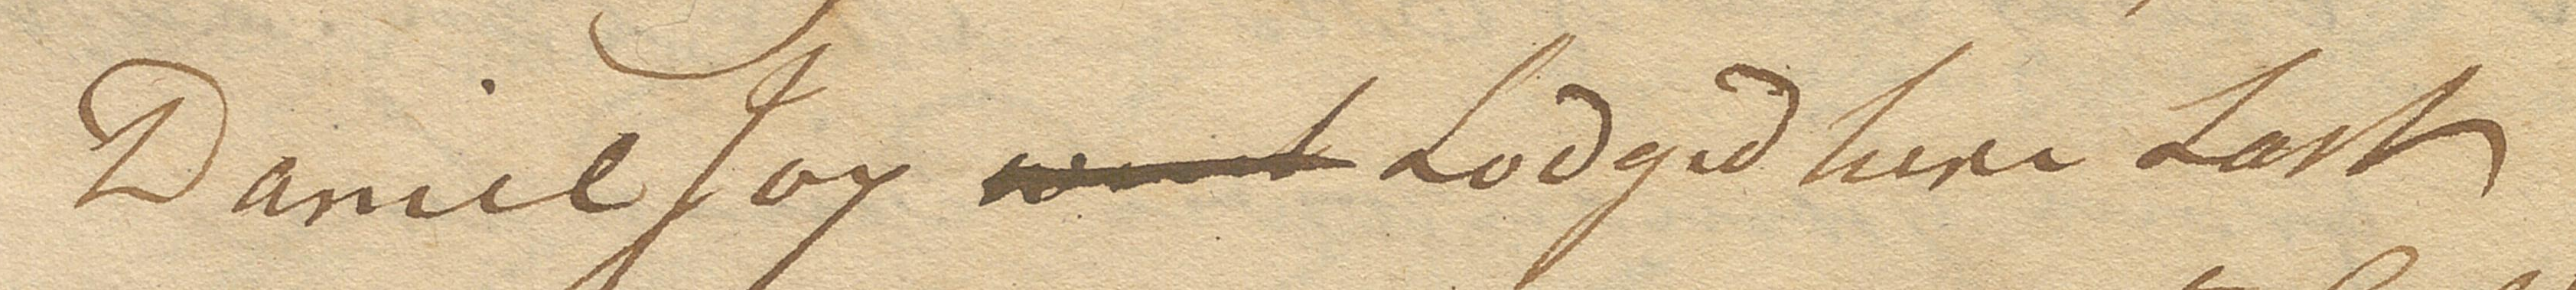Damel Joy [went] Lodged here Last
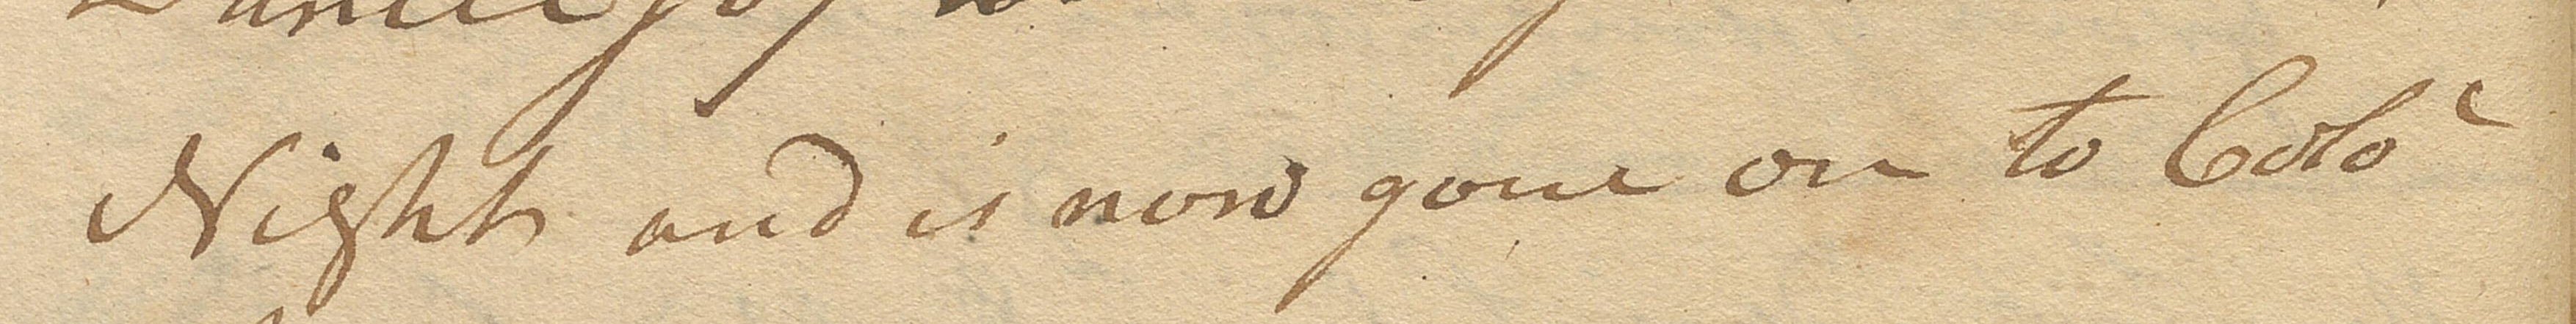Night and is now gone on to Colo^l
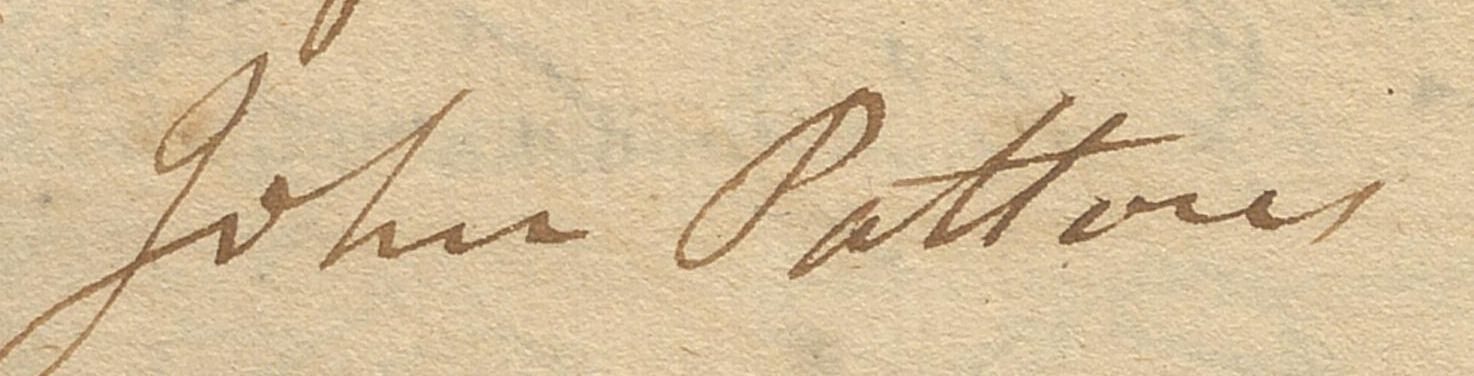John Pattons
